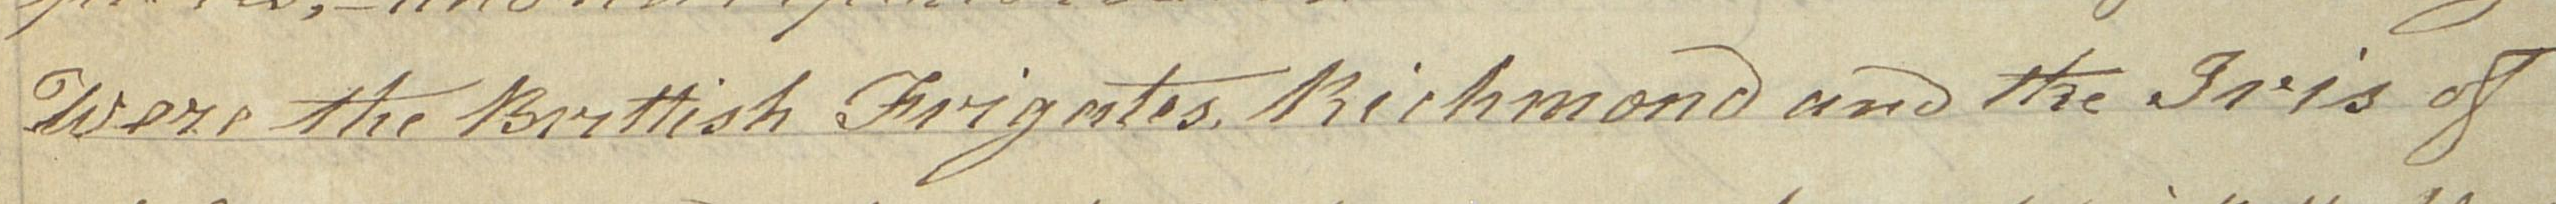were the Brittish Frigates Richmond and the Iris of
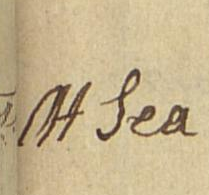At Sea
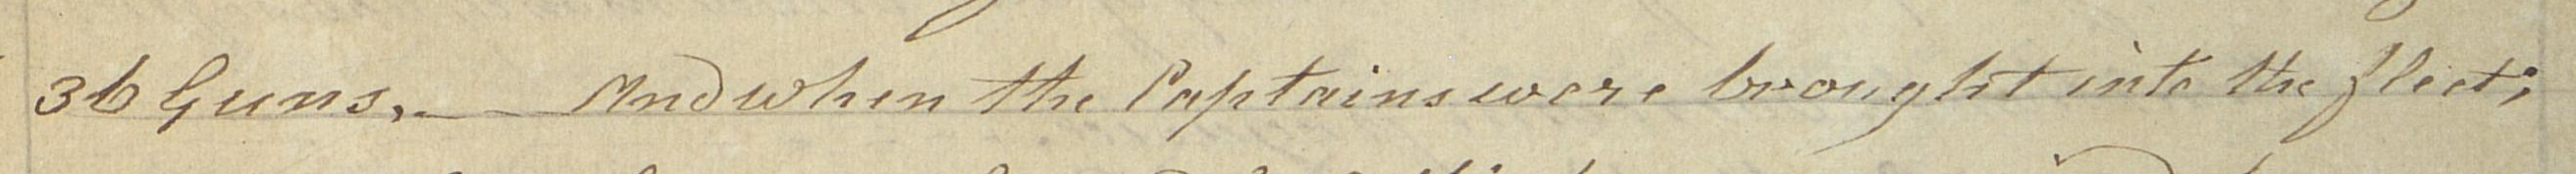36 Guns, And when the Captains were brought into the fleet;
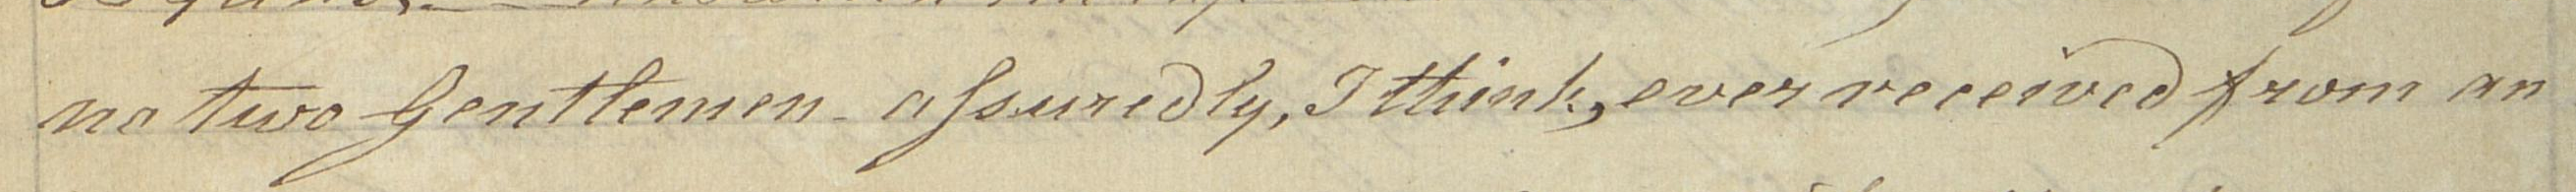no two Gentlemen assuredly, I think, ever received from an
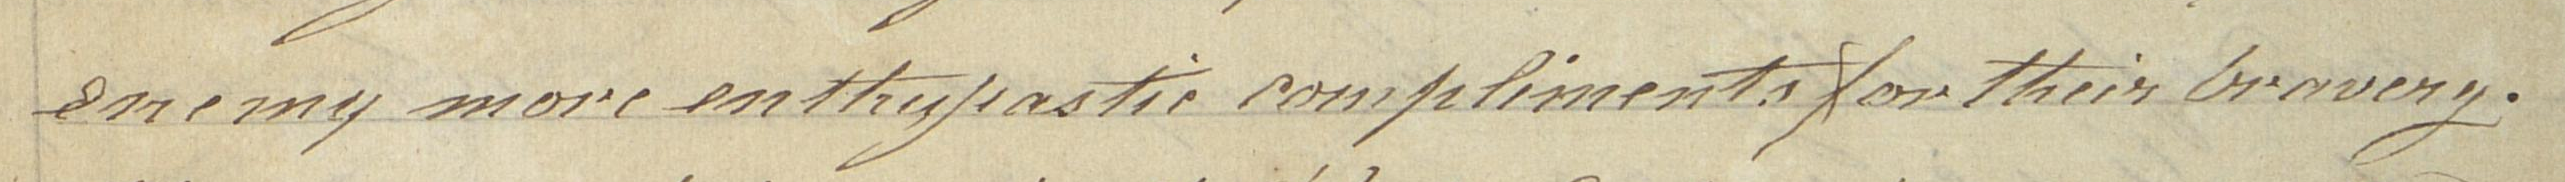enemy move enthusiastic compliments for their bravery.
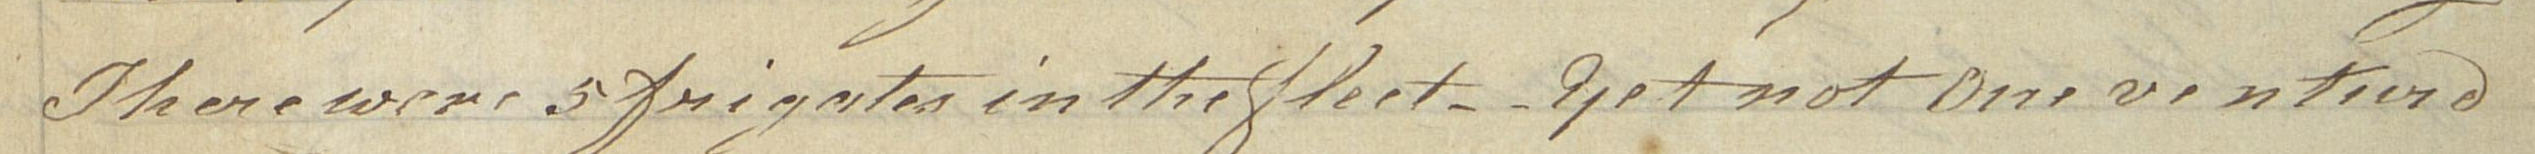There were 5 frigates in the fleet Yet not one venturd
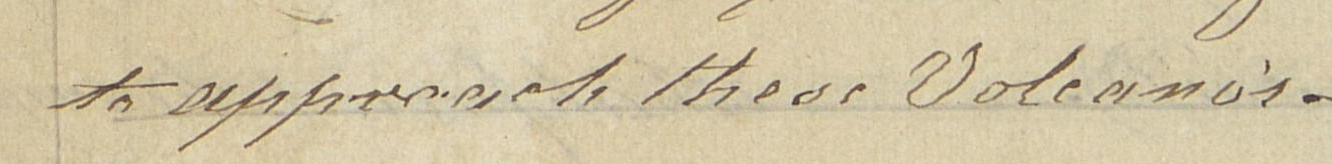to approach these Volcano's.
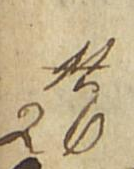26^th
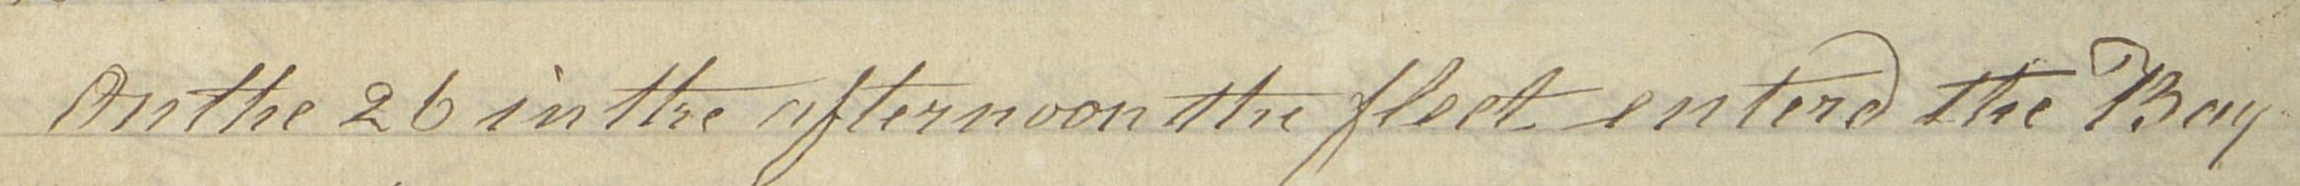On the 26 in the afternoon the fleet enterd the Bay
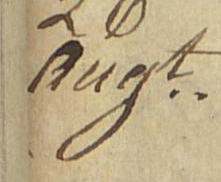Aug^t.
